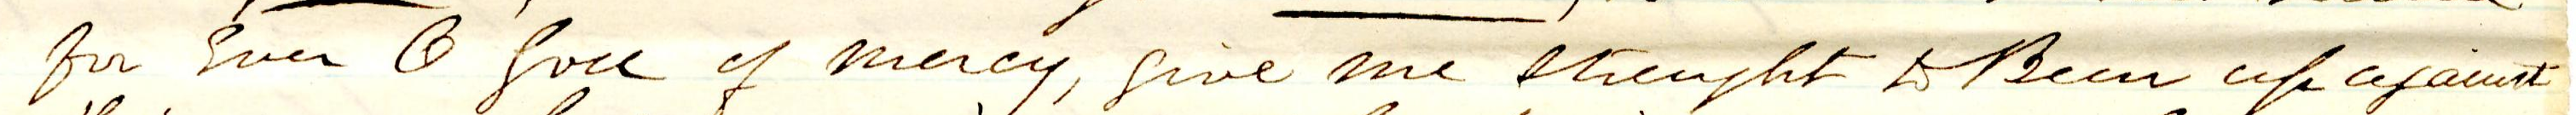for ever O God of mercy, give me strenght to Bear up against
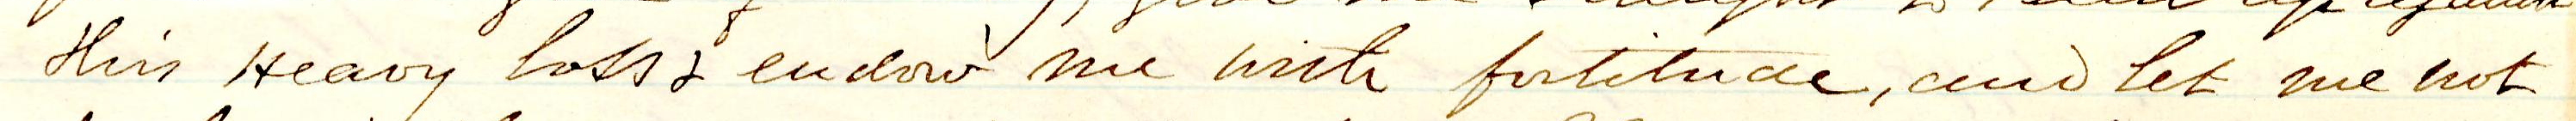this heavy loss endow me with fortitude, and let me not
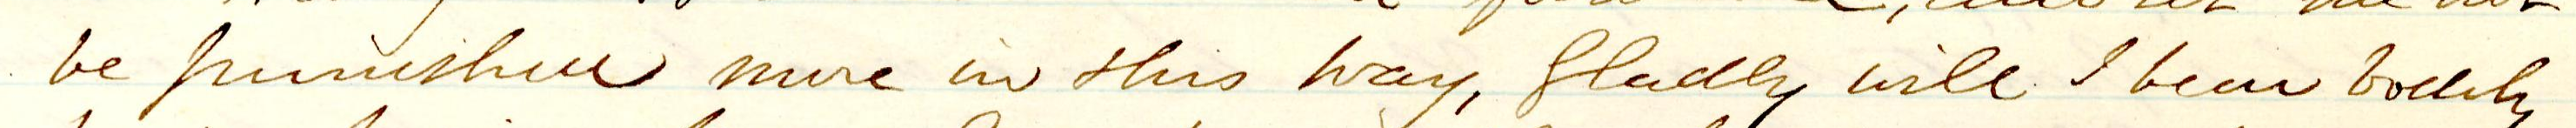be punished more in this way, gladly will I bear bodily
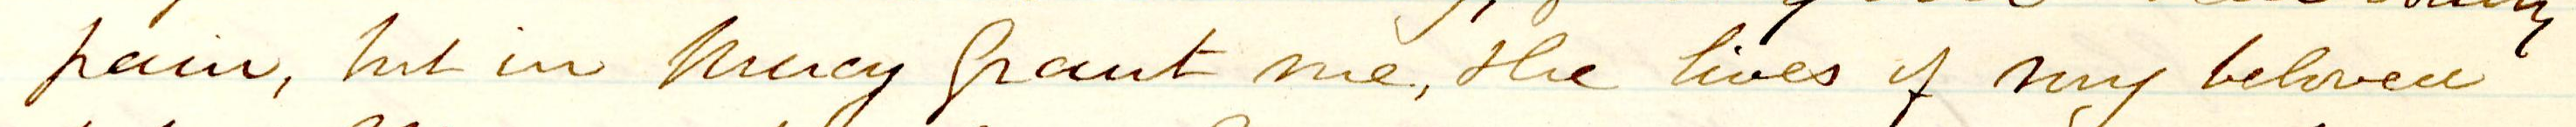pain, but in Mercy Grant me the lives of my beloved
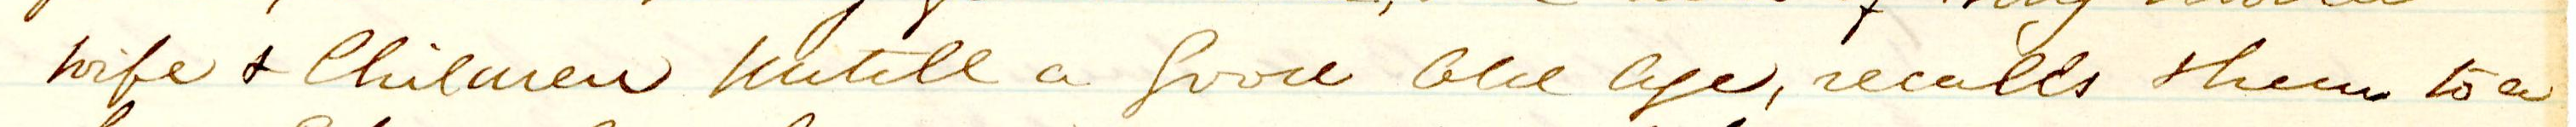wife & children until a good old age, recalls them to a
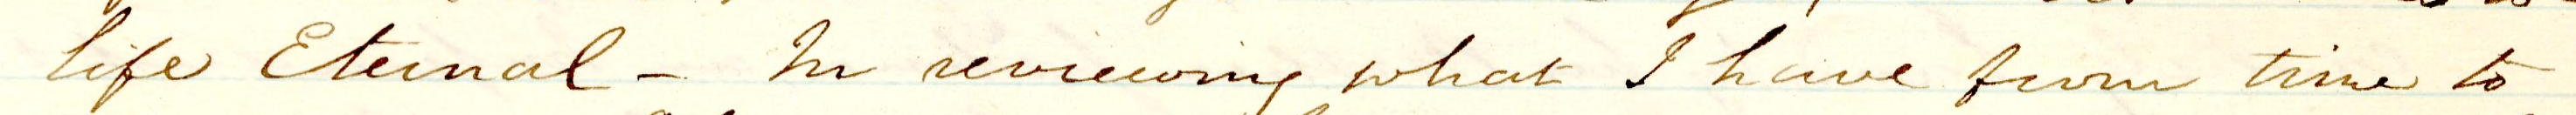life eternal- In reviewing what I have from time to
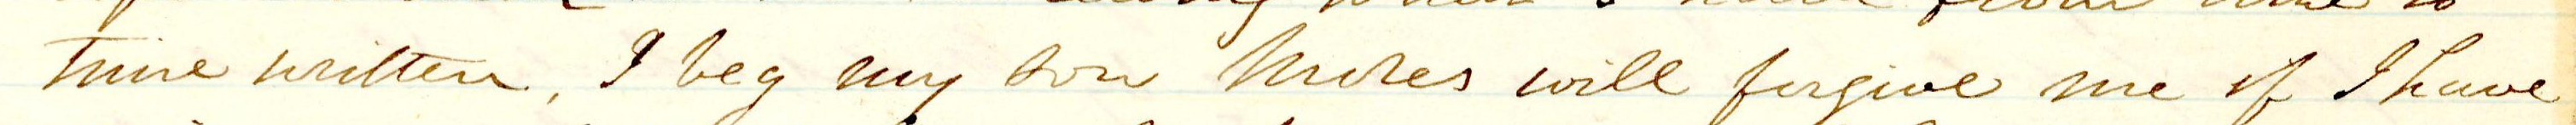time written, I beg my son Moses will forgive me if I have
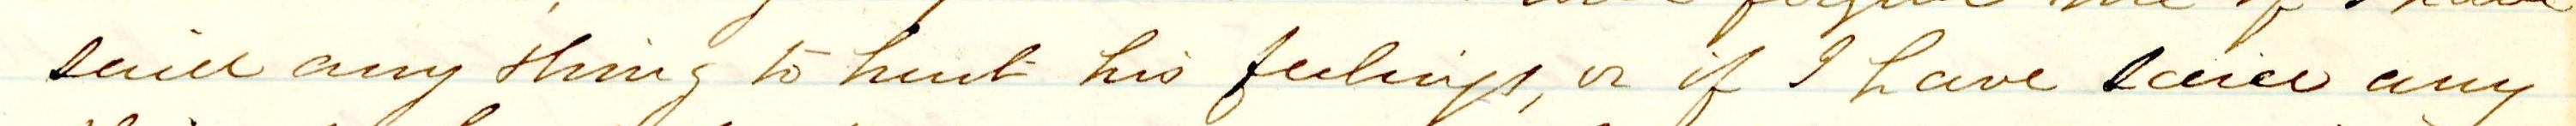said any thing to hurt his feelings, or if I have said any
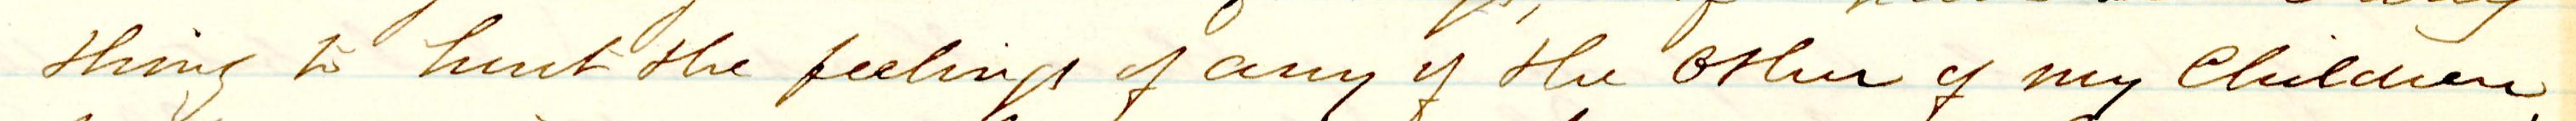thing to hurt the feelings of any if the Other of my Children
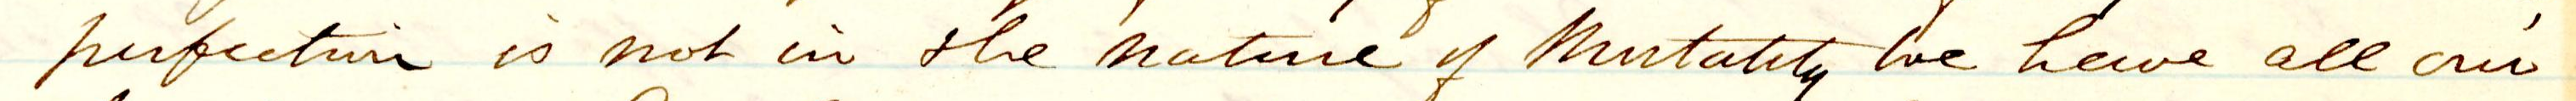perfection is not in the nature o mortality we have all our
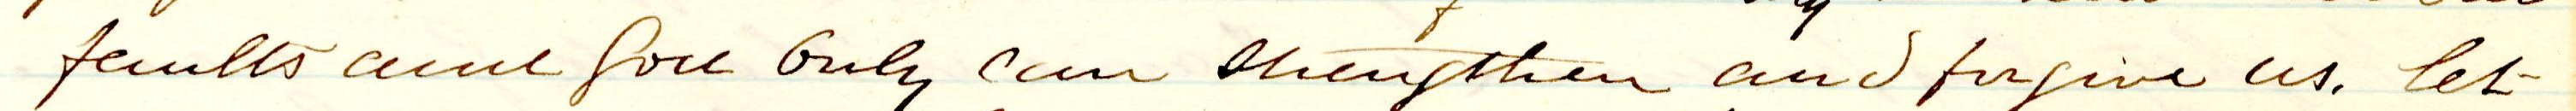faults and God only can strengthen and forgive us. let
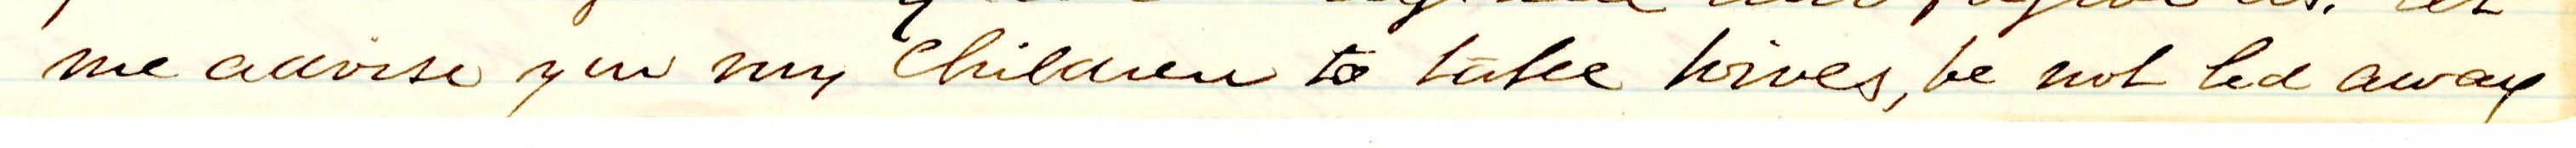me advise you my children to take wives, be not led away
